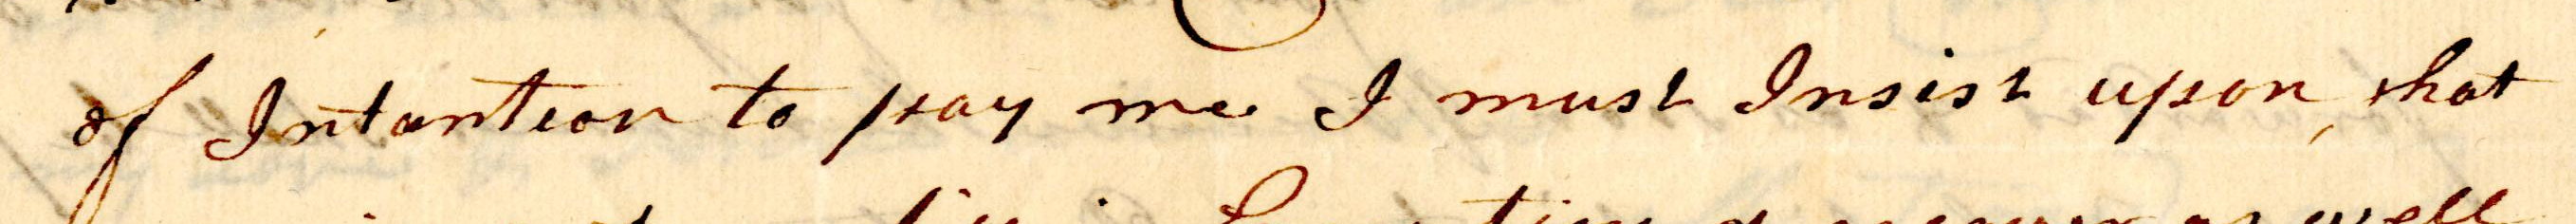of Intention to pay me I must Insist upon that
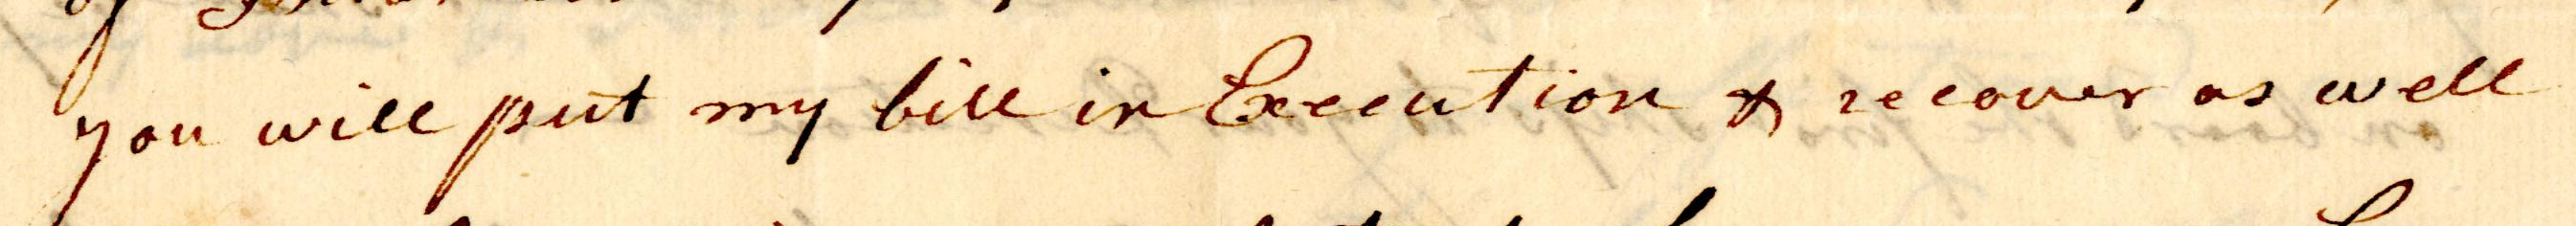you will put my bill in Execution & recover as well
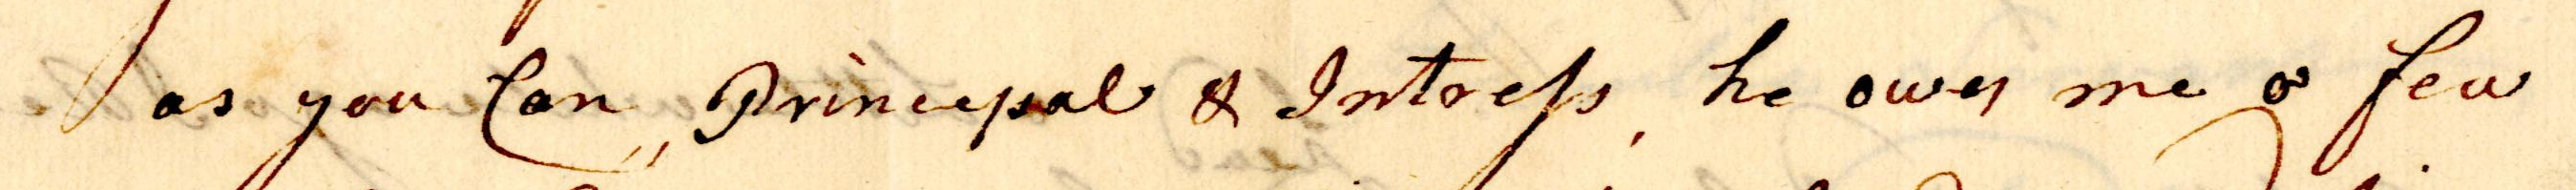as you Can, principal & Intress, he owes me a few
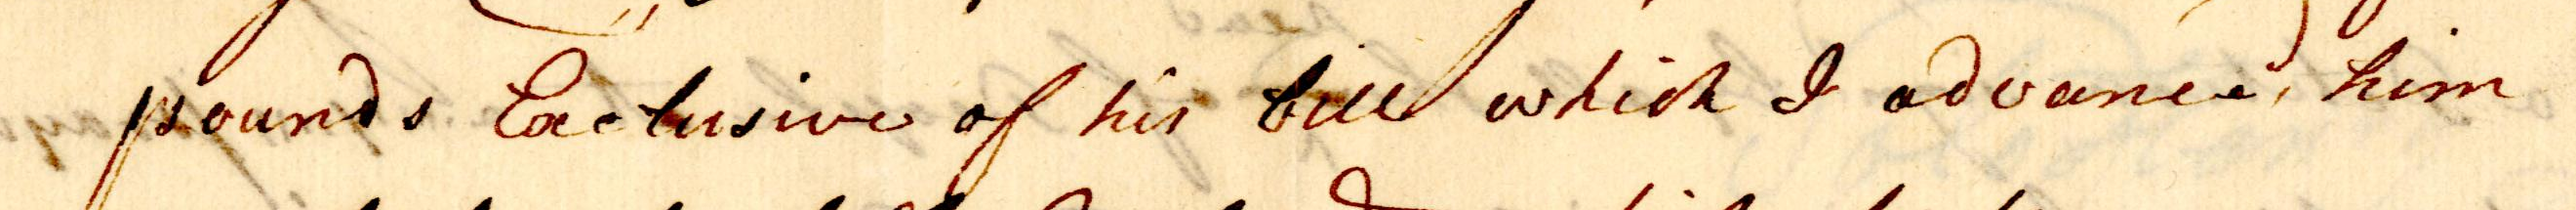pounds Exclusive of his bill which I advance him
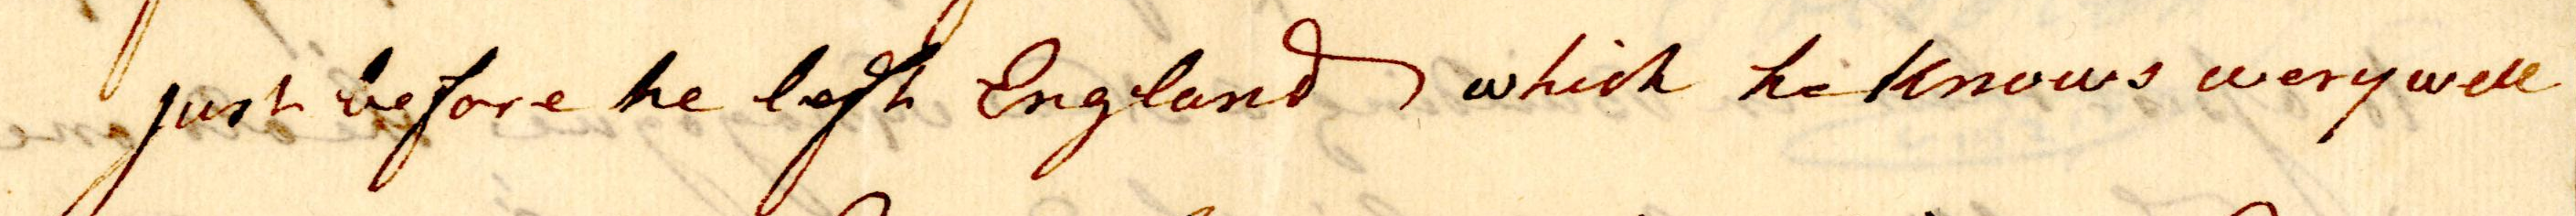just before he left England which he knows very well
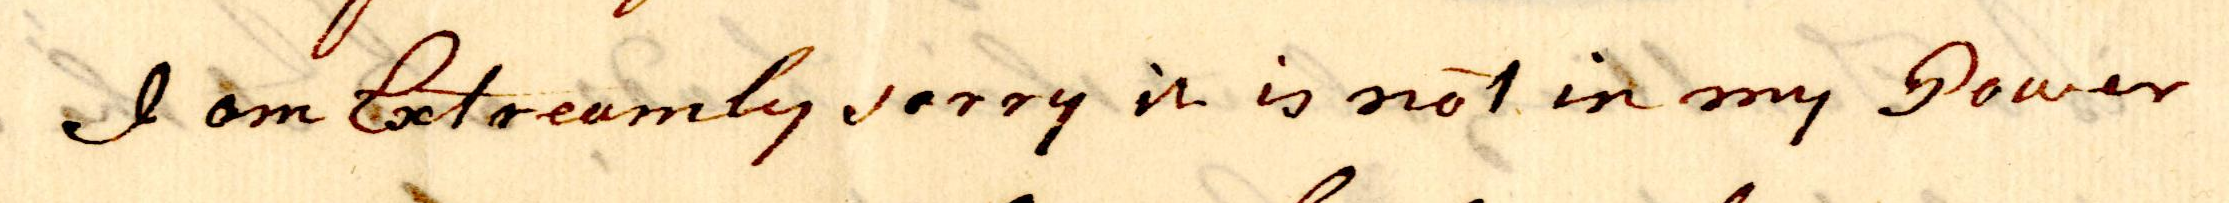I am Extreamly sorry it is not in my Power
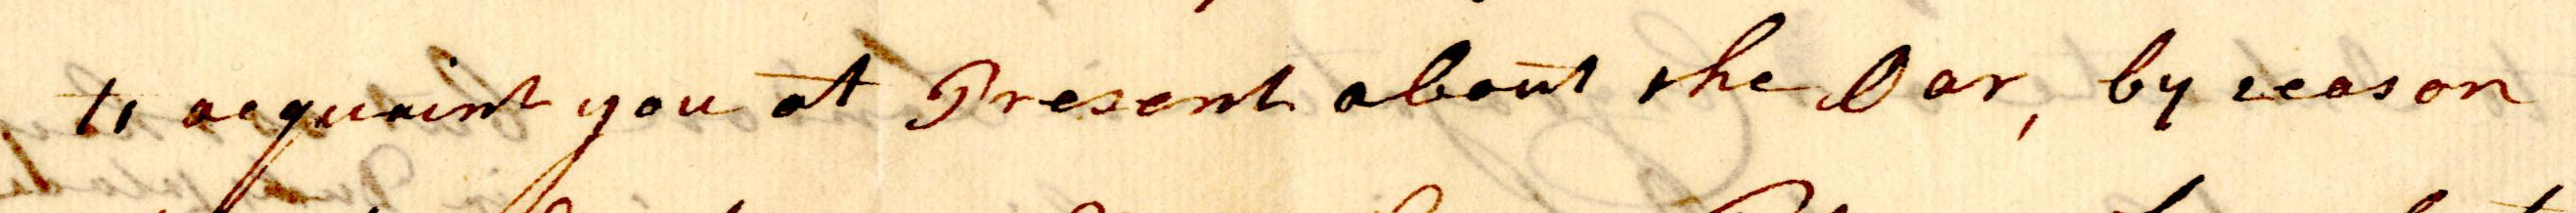to acquaint you at Present about the Dar, by reason
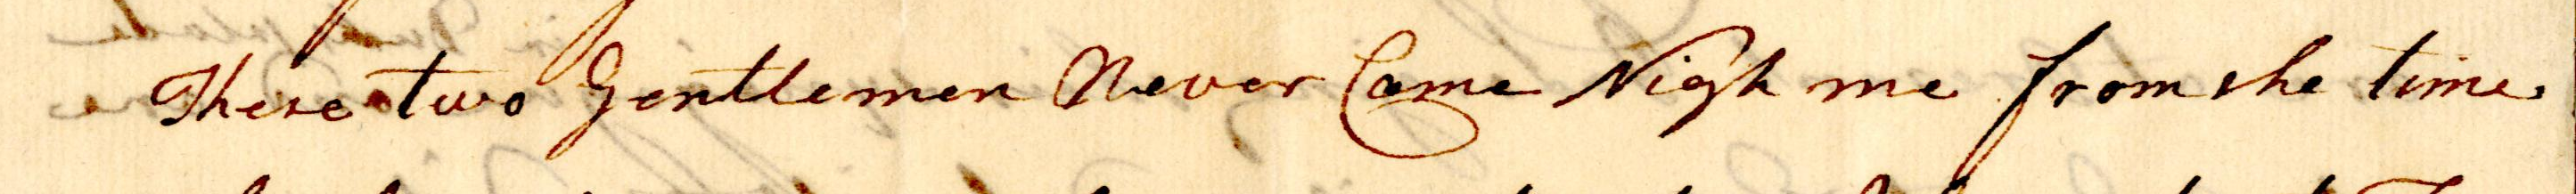These two Gentlemen Never Came Nigh me from the time
